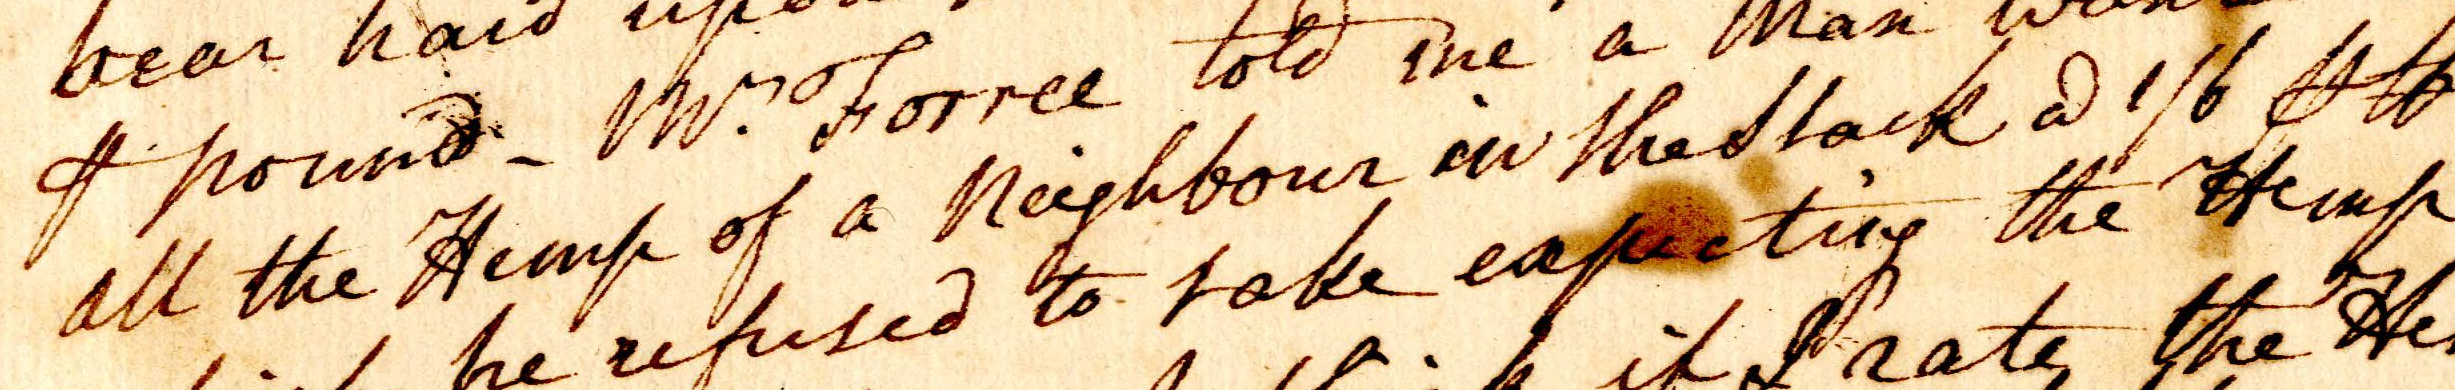all the Hemp of a Neighbour in the Stock a 1/6 per 16
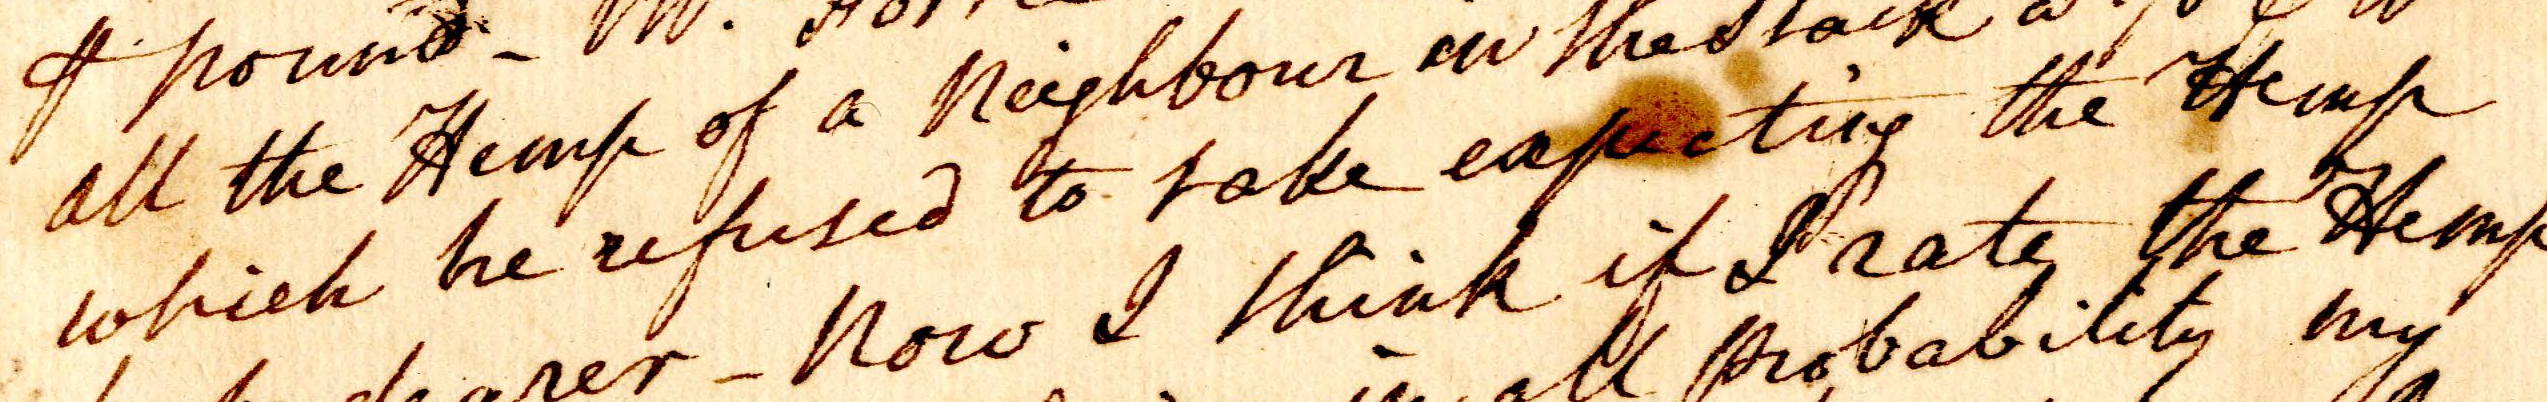which he refused to take expecting the Hemp
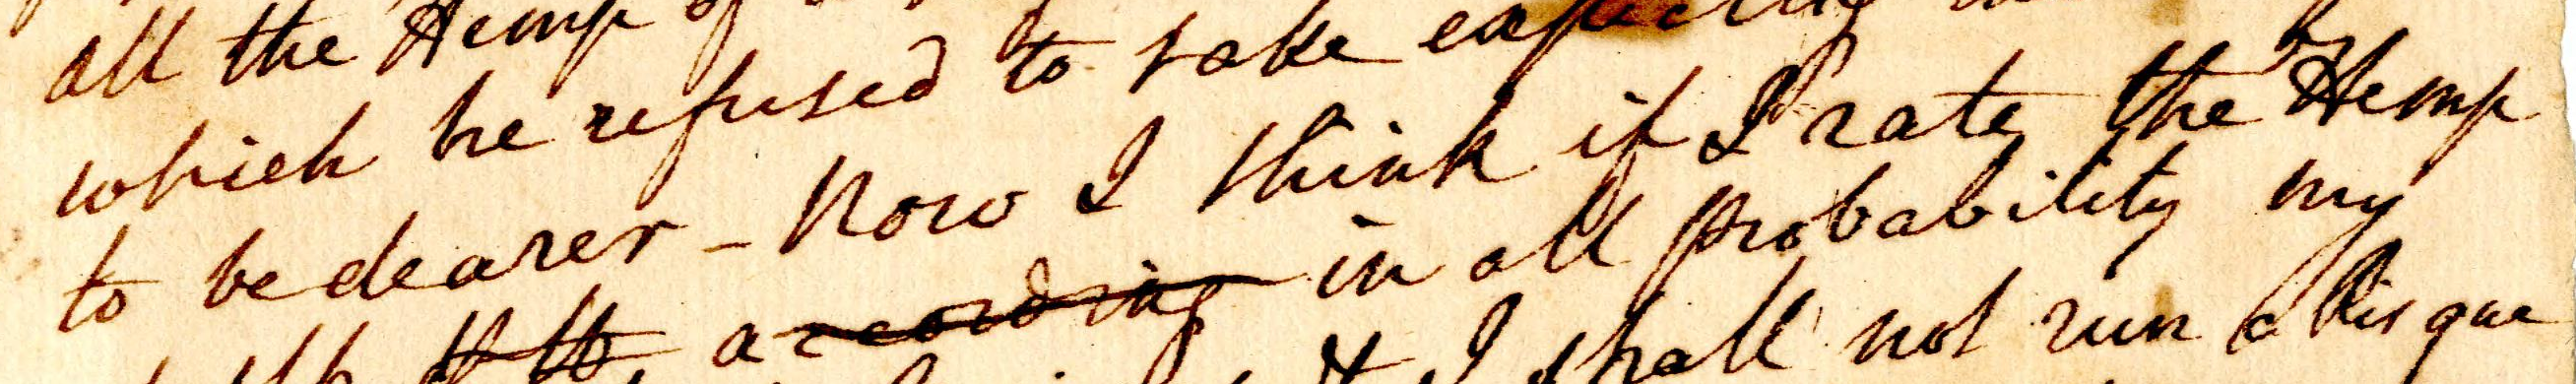to be dearer- Now I think if I rate the Hemp
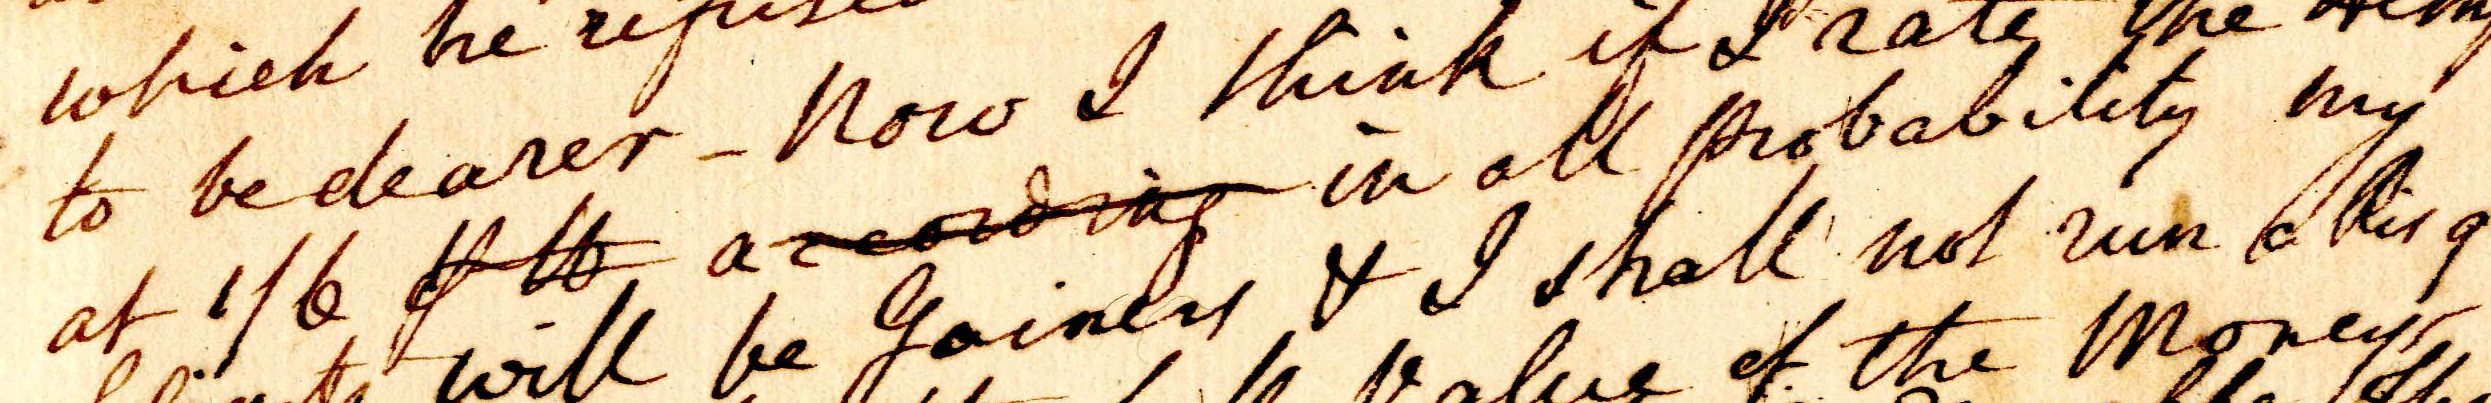at 1/6 per lb according in all probability my
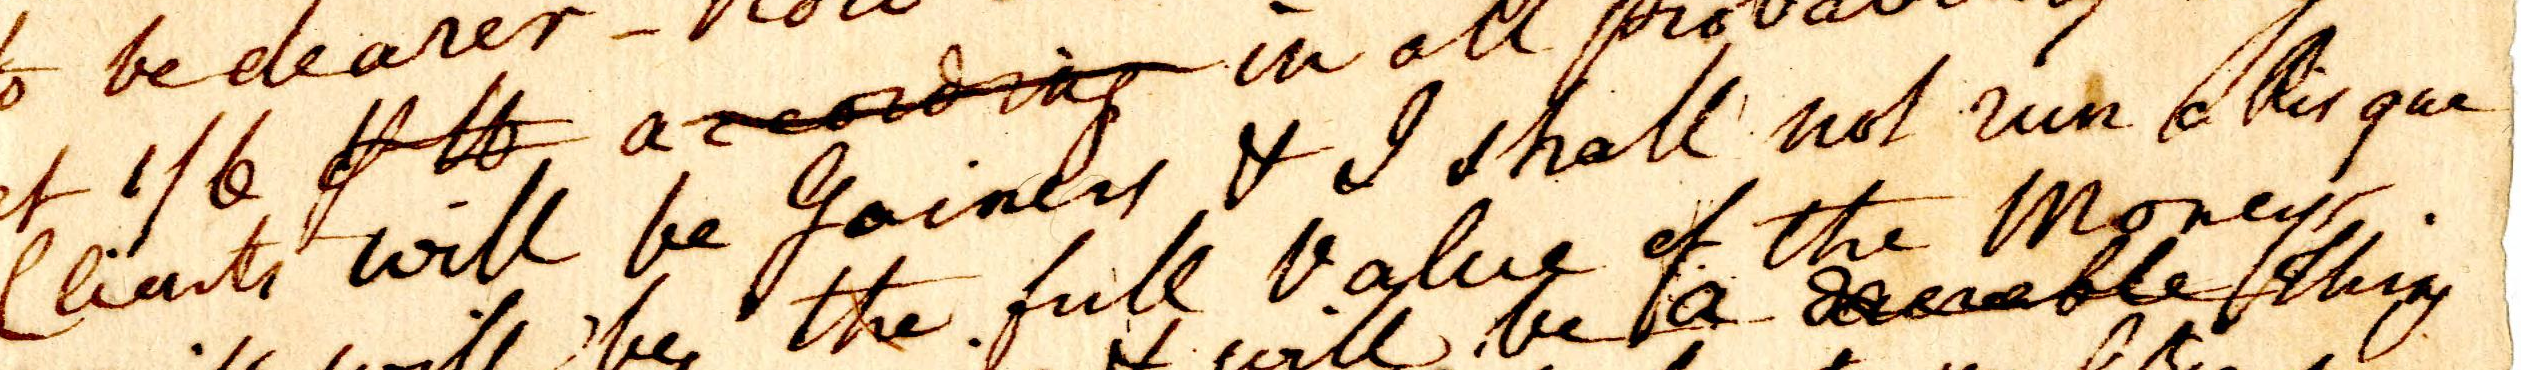Clients will be Gainers & I shall not run a Risque
